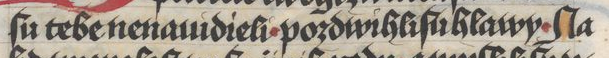ſu tebe nenauidieli.pozdwihli ſu hlawy.Na
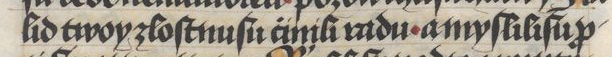lid twoy zloſtnu ſu ċinili radu.a myſliliſu ꝑ¬
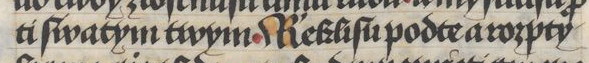ti ſwatym twym.Ṙekſiſu podte a rozpty¬
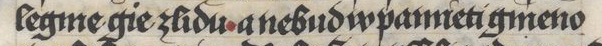legme gie zlidu.a nebud w pamieti gmeno
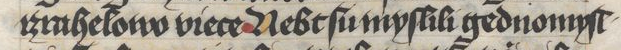izrahelowo viece.Nebt ſu myſlili gednomyſl¬
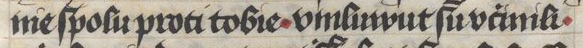nie ſpolu proti tobie.vmluwut ſu vċinili.
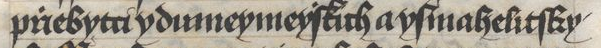pṙiebytci y dumeymeyẛkich a yſmahelitſky¬
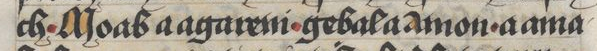ch.Moab a agareni.gebal a Amon.a ama
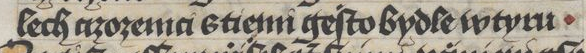lech cizozemci stiemi geẛto bydle wtyru.
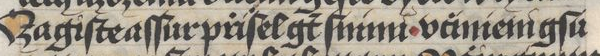Zagiſte aſſur pṙiẛel ḡt ſnimi.včinieni gſu
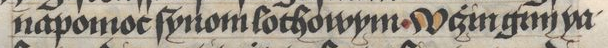napomoc ſynom lothowym.Vcżini gim ya¬
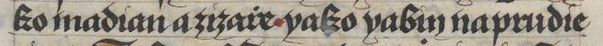ko madian a zizaṙe.yako yabin na prudie
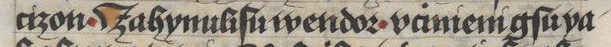cizon.Zahynuliſu wendor.vċinieni gſu ya¬
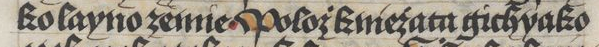ko layno zemie. Polož kníeżata gich yako
